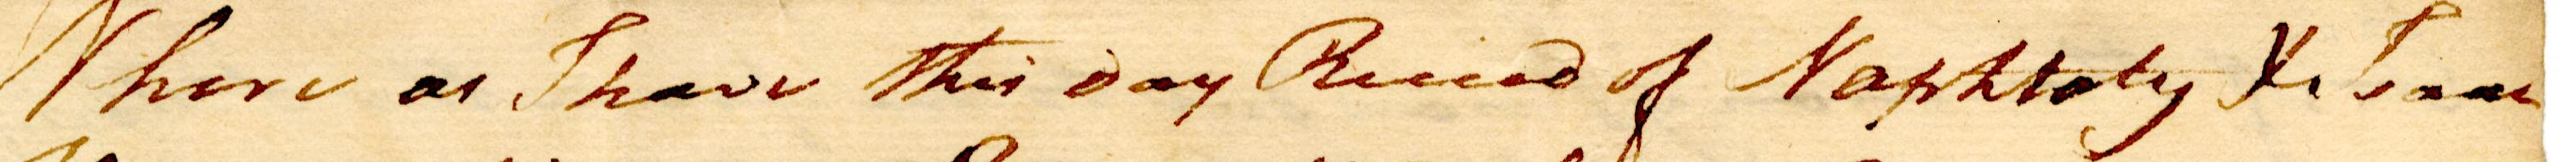Where as I have this day Recievd of Naphtaly & Isaac
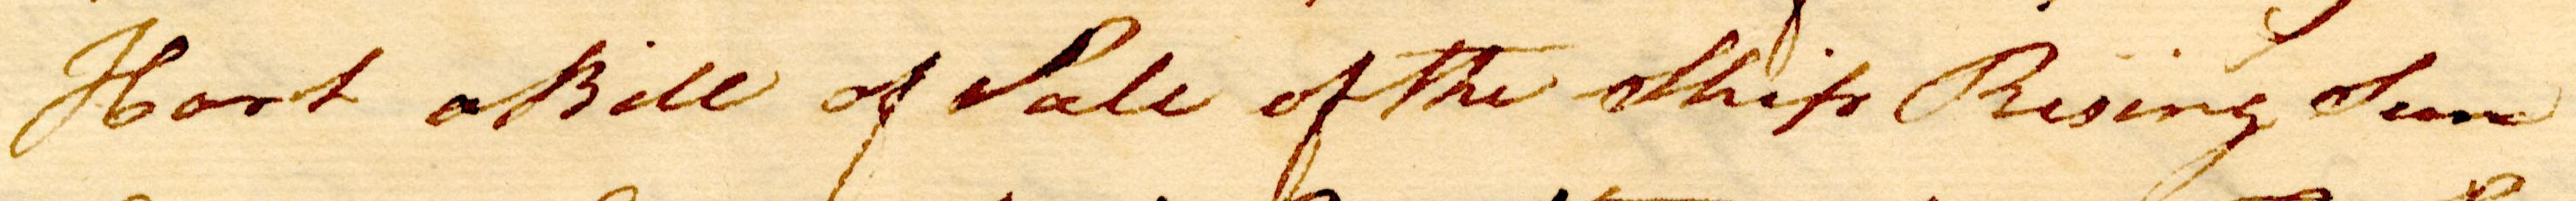Hart a Bill of Sale of the ships Rising Sun
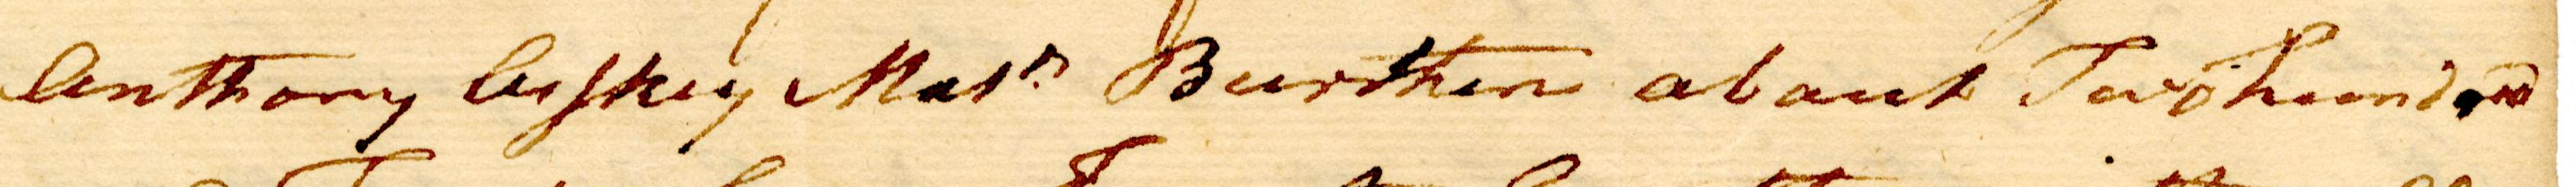Anthony Caskey Maj^r. Burthan about Two hundred
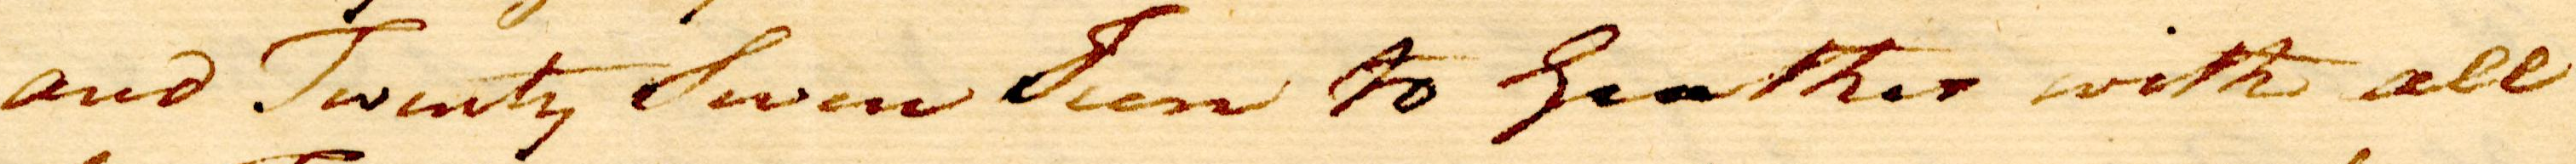and Twenty Seven Ton to Geather with all
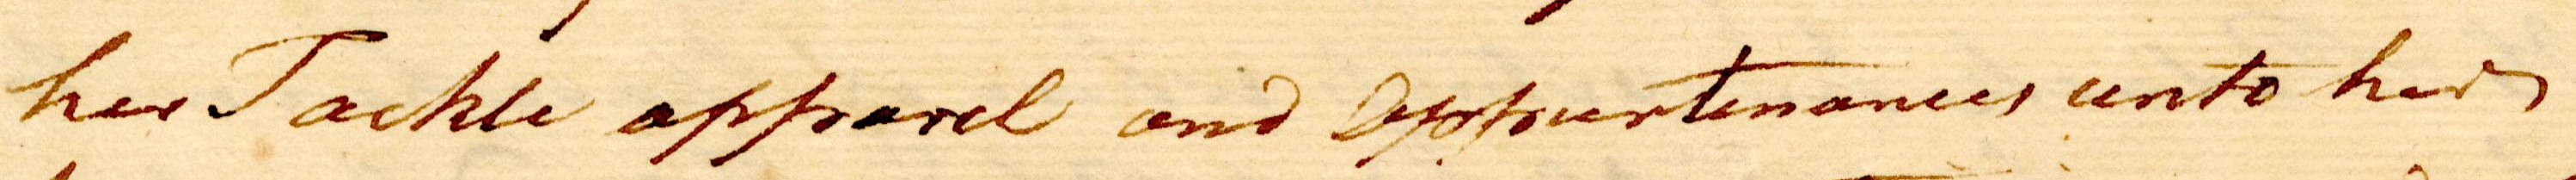his Tackle apparel and opportunances unto her
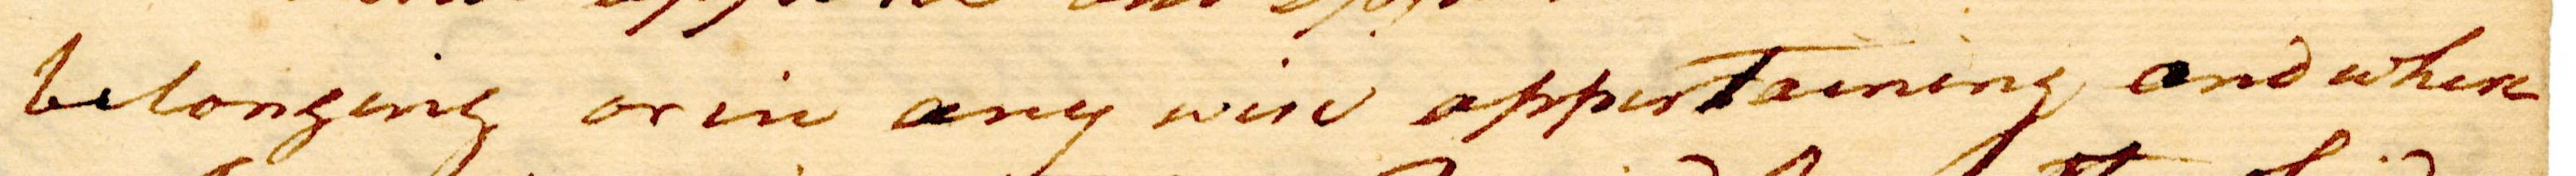belonging or in any wise appertaining and where
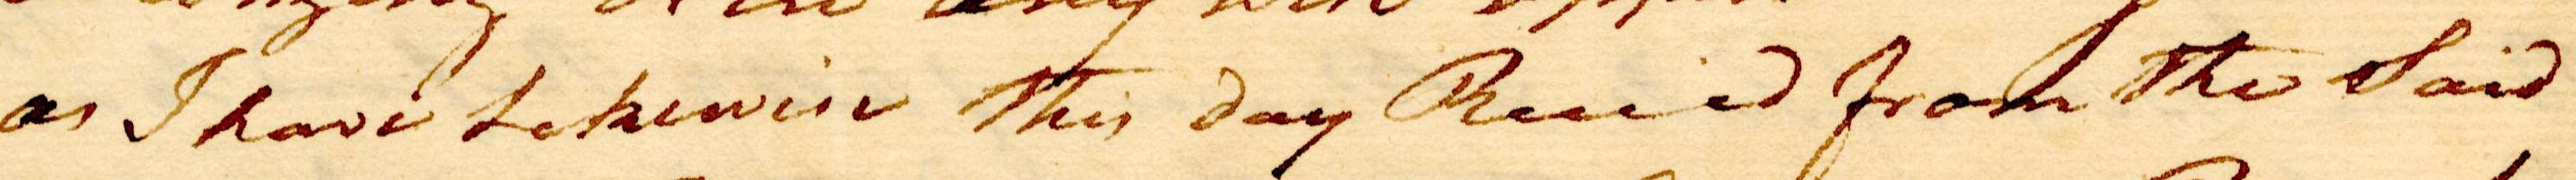as I have likewise this day Received from the Said
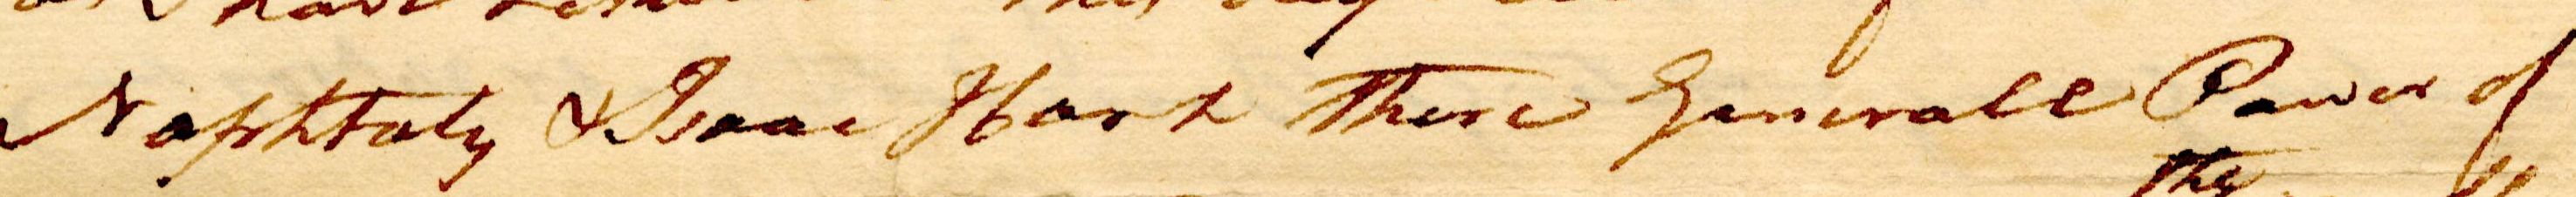Naphtaly & Isaac Hart there Generall Power of
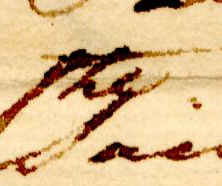the
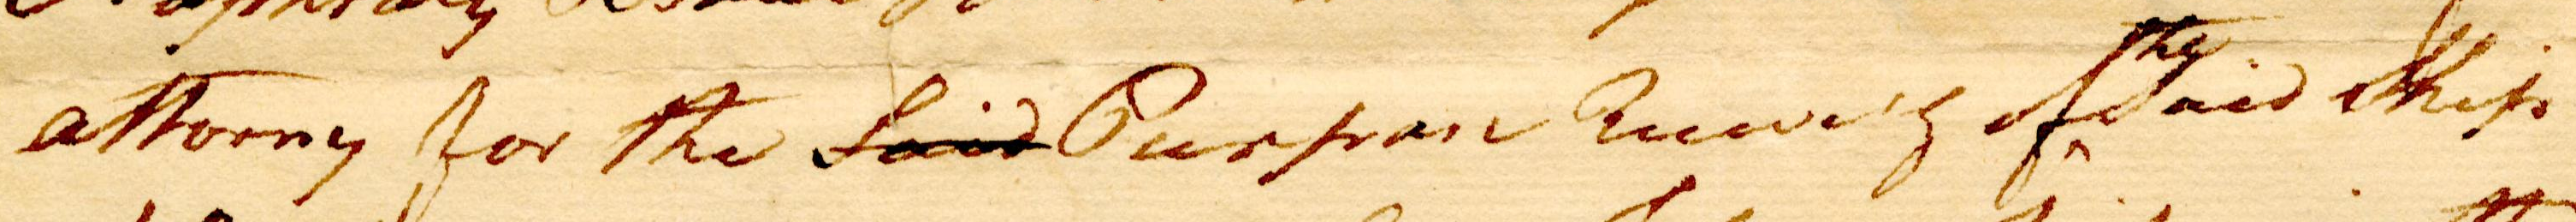attorny for the [said] Purpose receive'g of ^ said Ship
